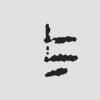上
